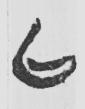㠯（以）
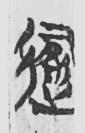逐
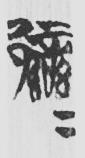{邑䜌}=
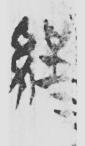{糸呈}=
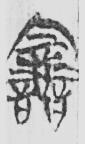{宀言言言}
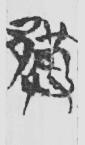巷
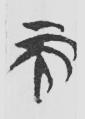而
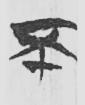不
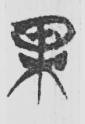果
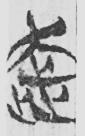奔
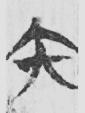內
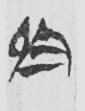於
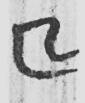曲
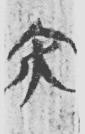夭
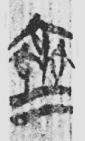齊
